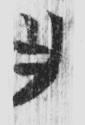出
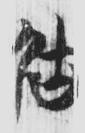居
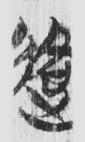○（路）
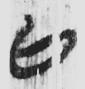㠯（以）
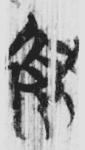须
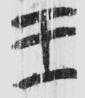王
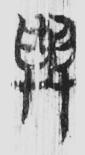與
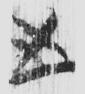之
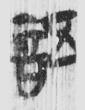○（语）
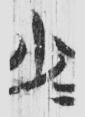少
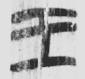王
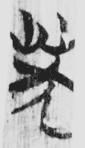○（笑）
